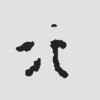亓（其）
